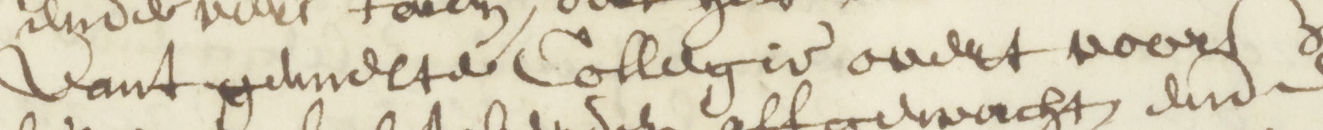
vant gemelte Collegie overt voorsz
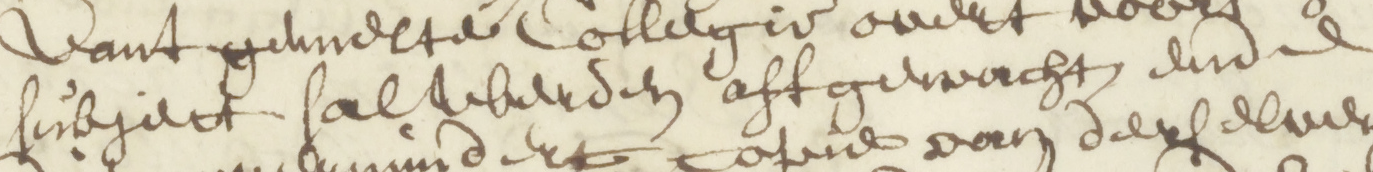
subject sal werden affgewacht, ende
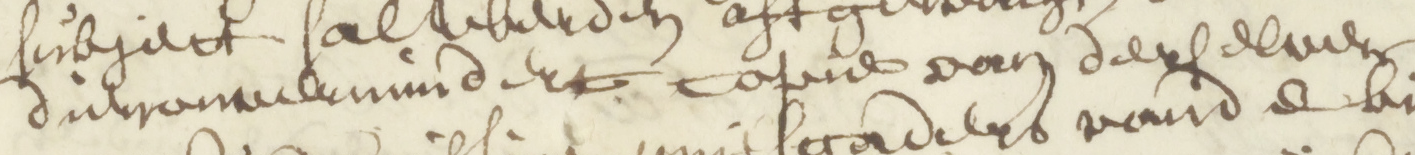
dien onvermindert copie van derselver
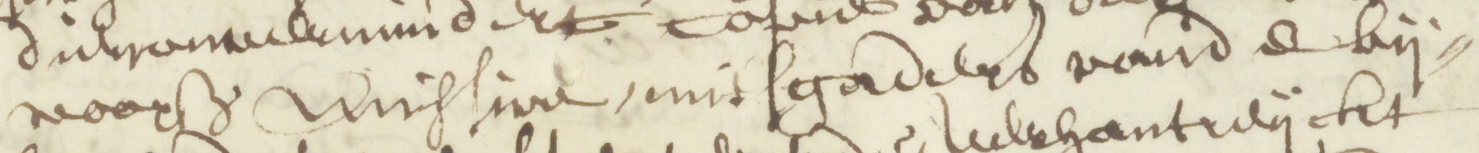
voorsz Missive, mitsgaders vande bij„
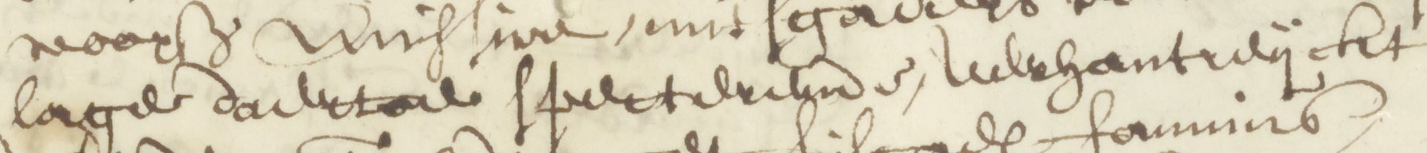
lage daertoe specterende, verhantreijckt
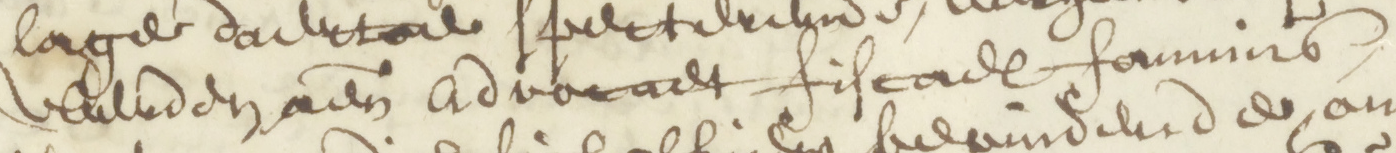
werden aen Advocaet fiscael fannius,
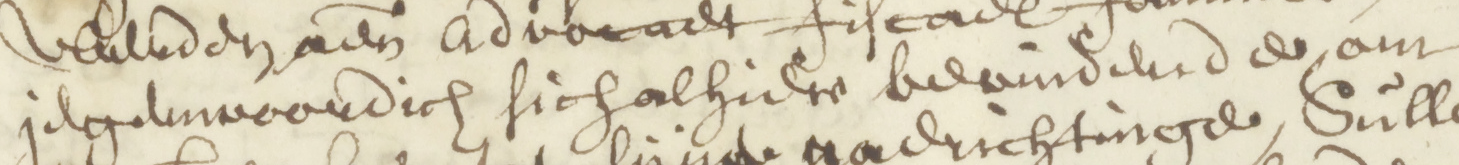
jegenwoordich sich alhier bevindende, om
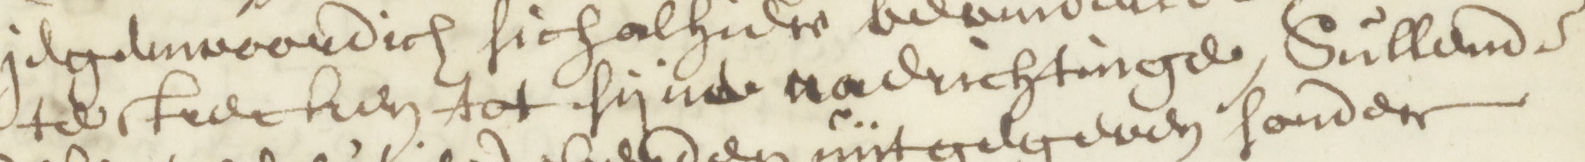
te strecken tot sijne naerichtinge, Sullende
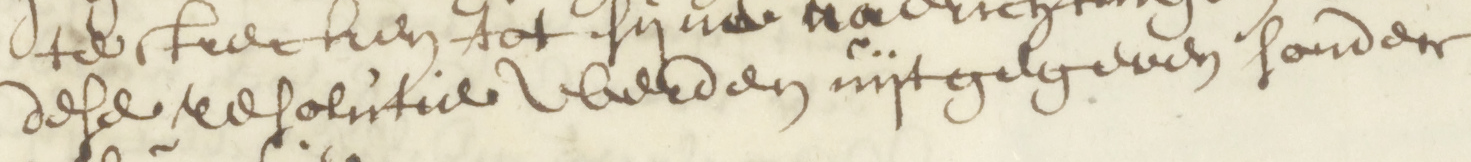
dese resolutie werden uijtgegeven sonder
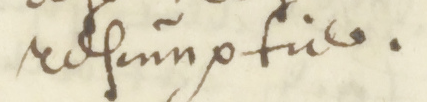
resumptie.
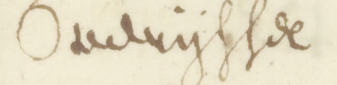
Overijssel
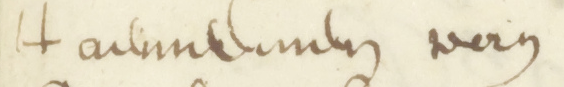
‛t aennemen van
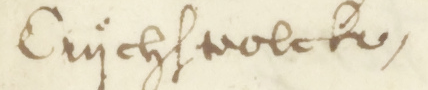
Crijchsvolck.
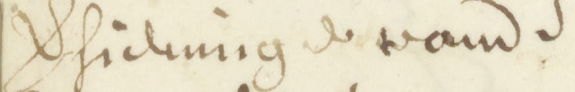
&sieninge vande
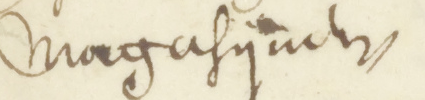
Magasijnen.
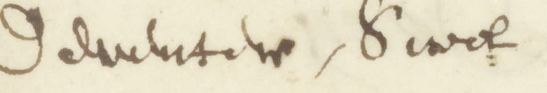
Deventer, Swol
